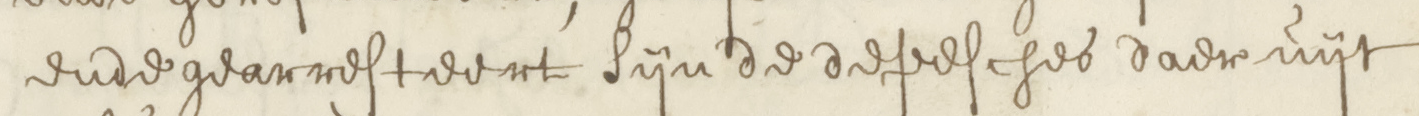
ende gearresteert sijn de depesches daer uijt
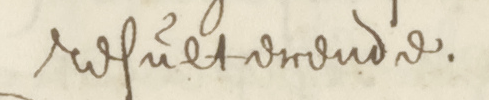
resulterende.
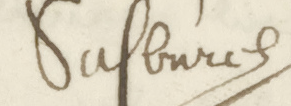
Sasburch
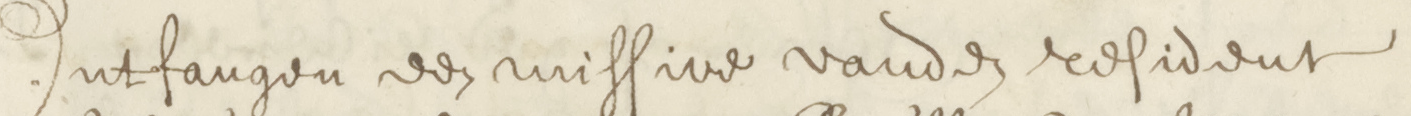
Ontfangen een missive vanden resident
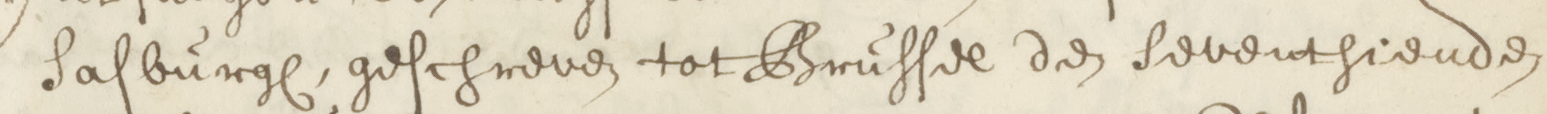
Sasburgh, geschreven tot Brussel den seventhienden
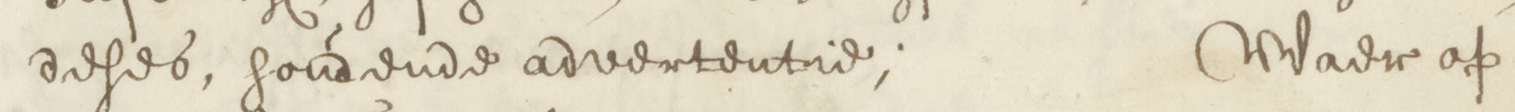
deses, houdende advertentie; Waer op
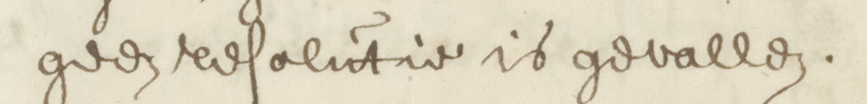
geen resolutie is gevallen.
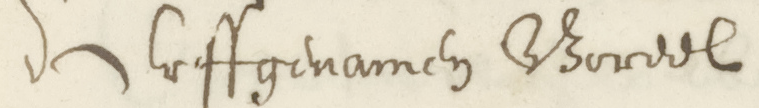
d‛ Erffgenamen Boreel
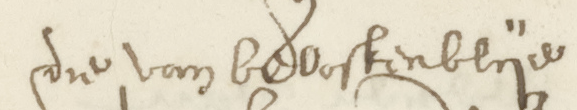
ca. die van beOostenblije
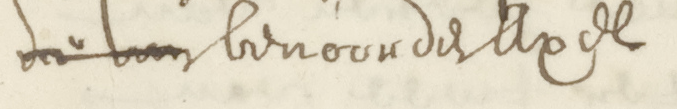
die van benoorden Axel
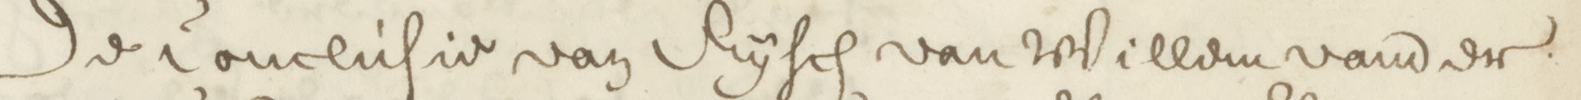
De Conclusie van Eijsch van Willem vander
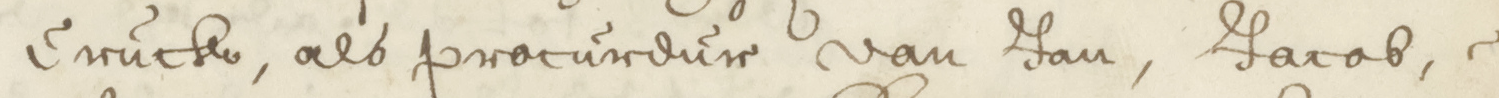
Cruck, als procureur van Jan, Jacob,
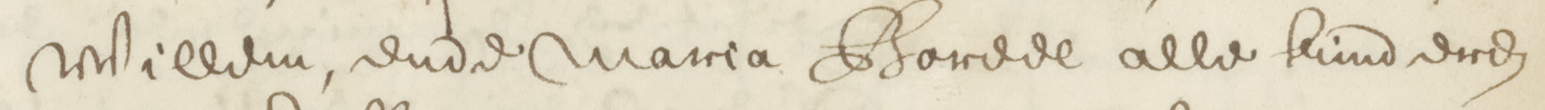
Willem, ende Maria Boreel alle kinderen
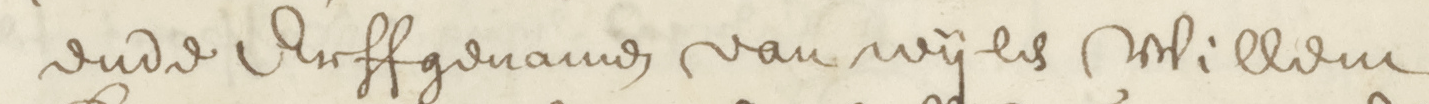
ende Erffgenamen van wijlen Willem
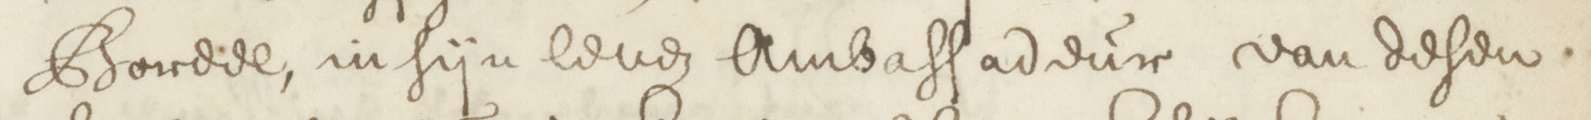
Boreel, in sijn leven Ambassadeur van desen,
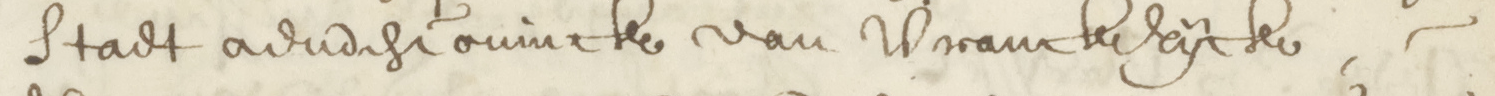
Staet aenden Coninck van Vranckrijck
